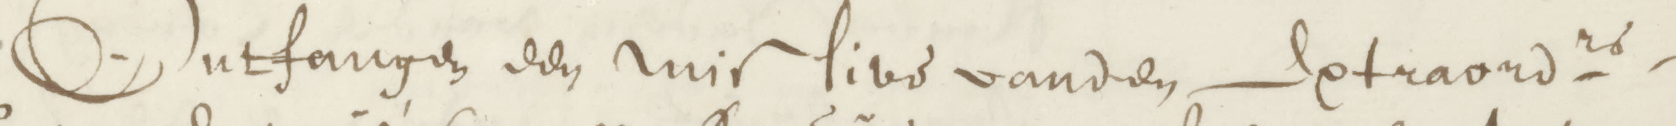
Ontfangen een missive vanden Extraordrs.
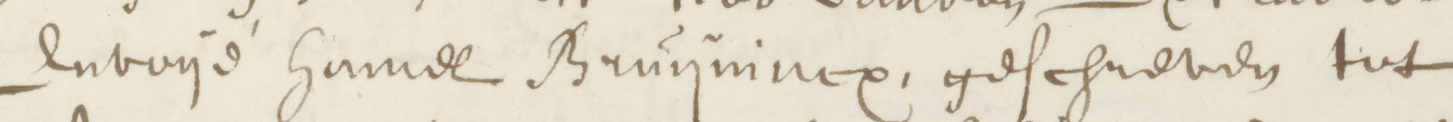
Envoijé Hamel Bruijnincx, geschreven tot
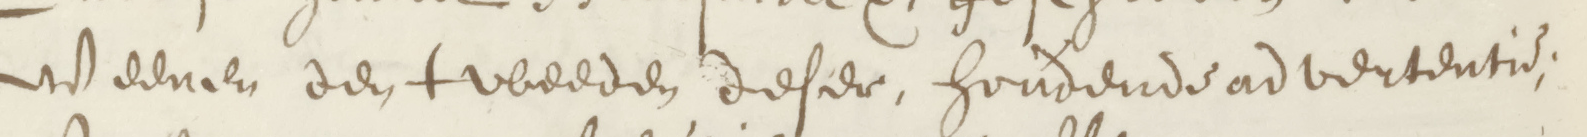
Weenen den tweeden deser, houdende advertentie:
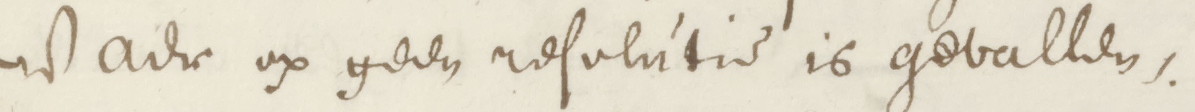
Waer op geen resolutie is gevallen.
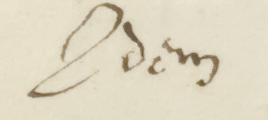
Idem
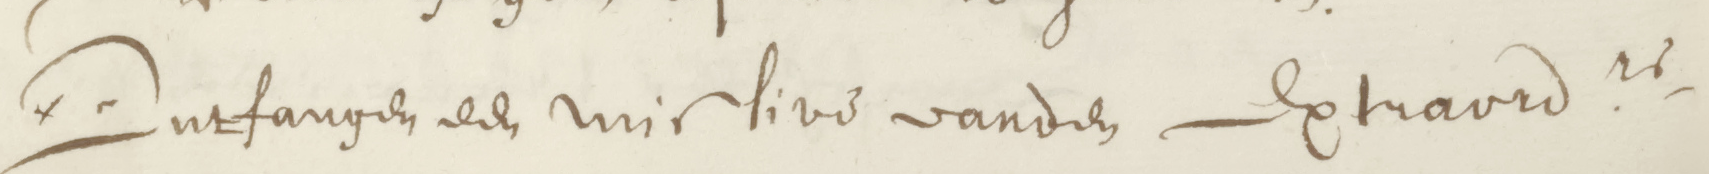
Ontfangen een missive vanden Extraordrs.
